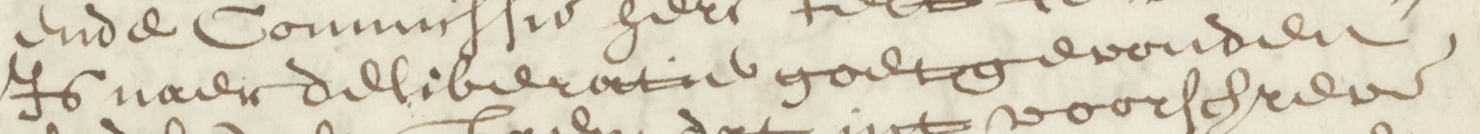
Is naer deliberatie goetgevonden
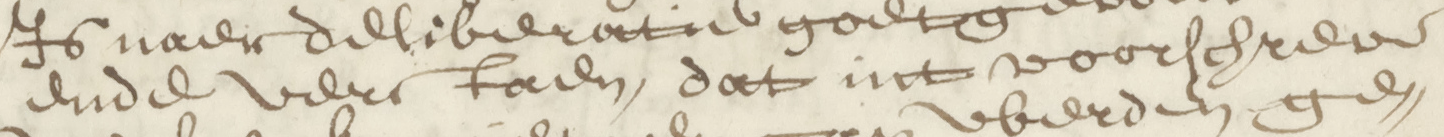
ende verstaen, dat int voorschreve
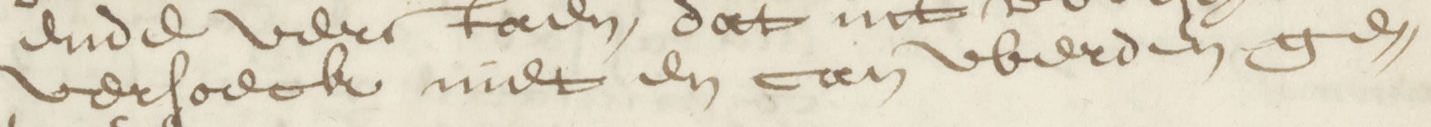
versoeck niet en can werden ge,
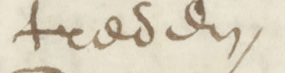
treden.
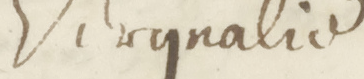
Verqualie
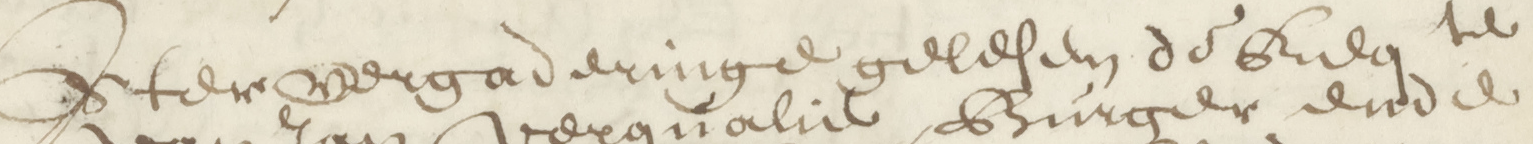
Is ter vergaderinge gelesen de Reqte
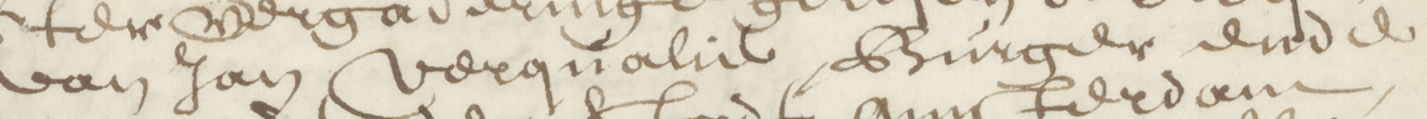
van Jan Verqualie, Burger ende
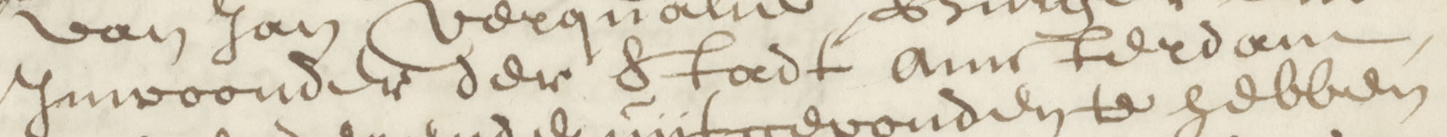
Inwoonder der Stadt Amsterdam,
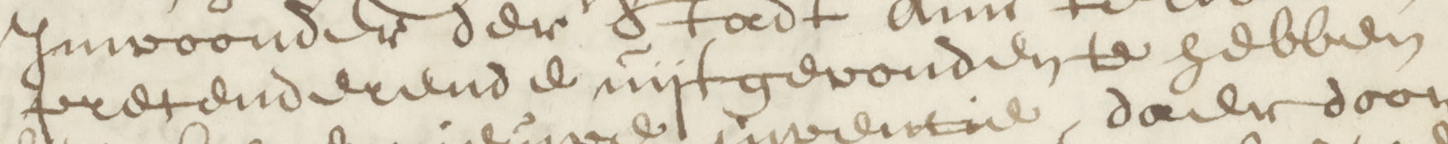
pretenderende uijtgevonden te hebben
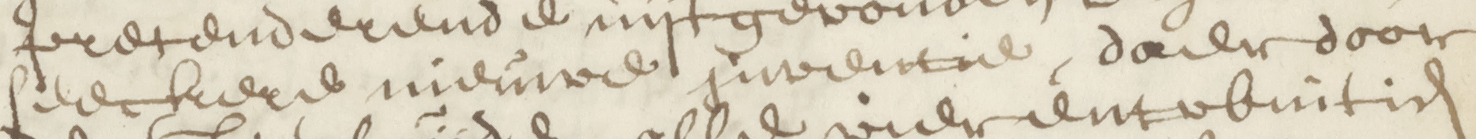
seeckere nieuwe inventie, daerdoor
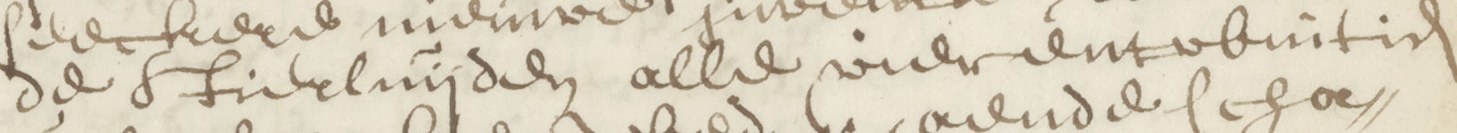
de Stierluijden alle vierentwintich
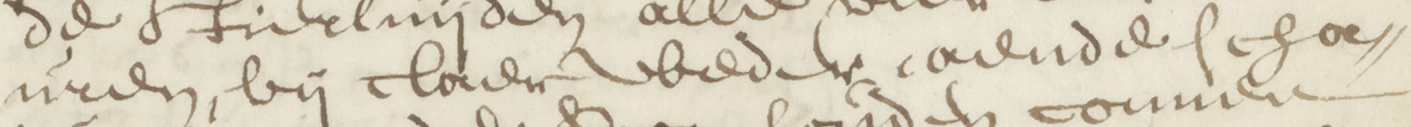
uren, bij claer weder, aende scha,,
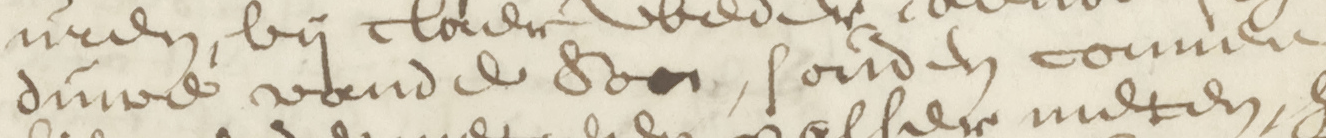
duwe vande Son, souden connen
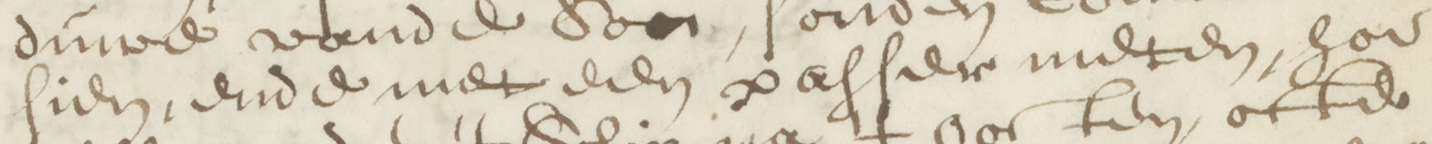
sien, ende met een passer meten, hoe
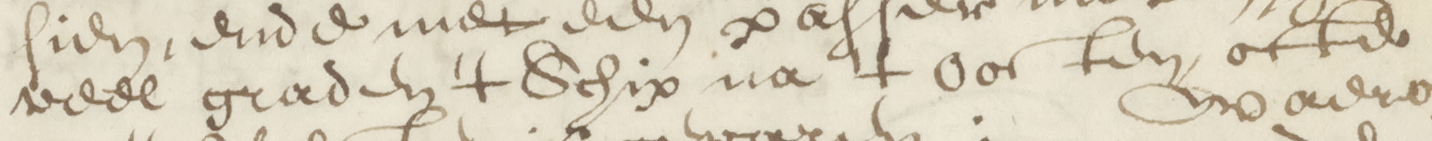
veel graden 't Schip na 't oosten, ofte
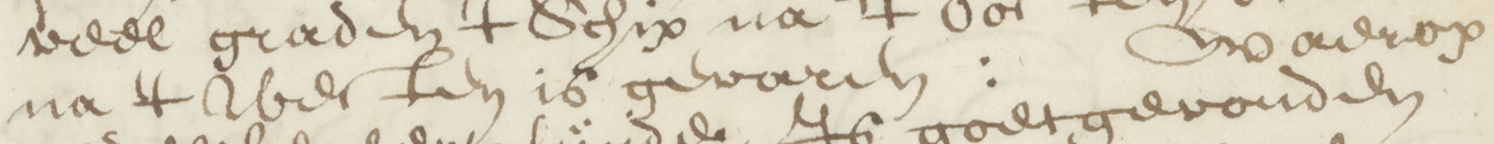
na 't Westen is gevaren: Waerop
